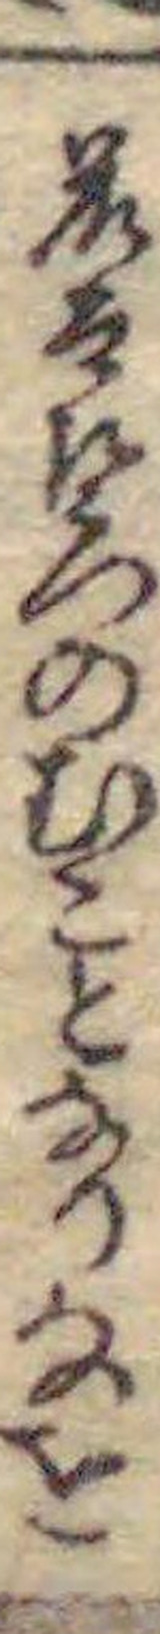藤太左衛門のむすことなりなを
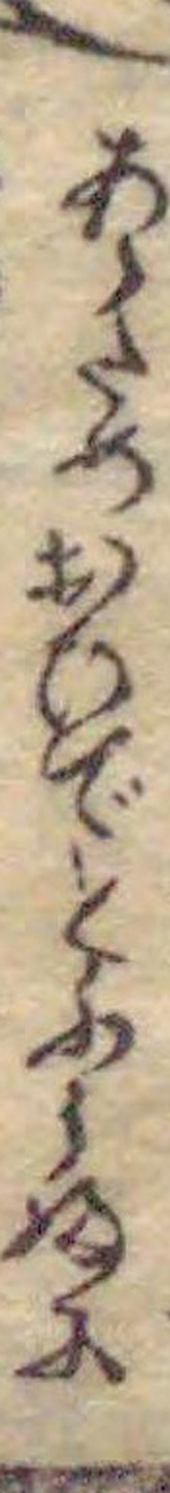あらためおひでとふうふに
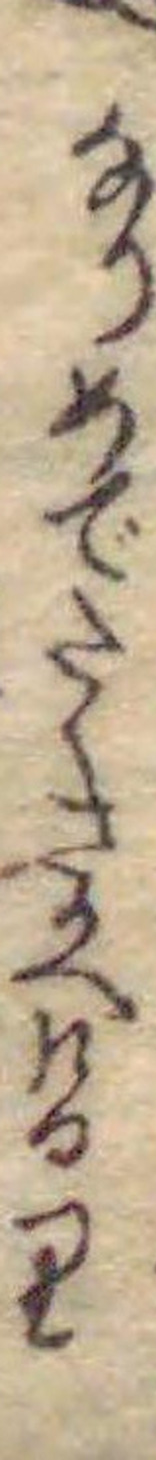なりめでたくさかへけるり
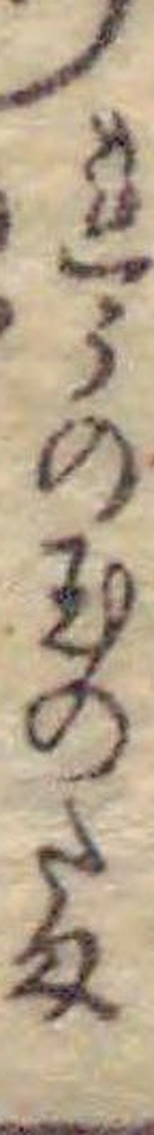うくうの玉のたま
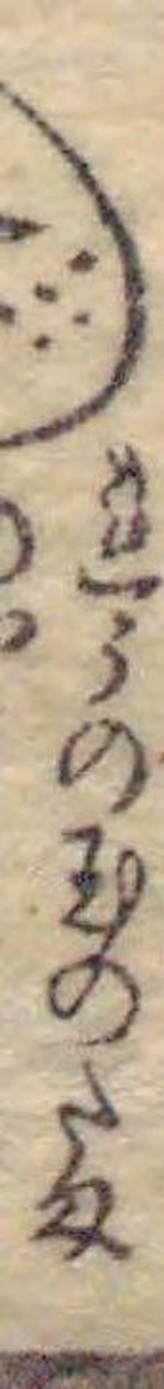うくうの玉のたま
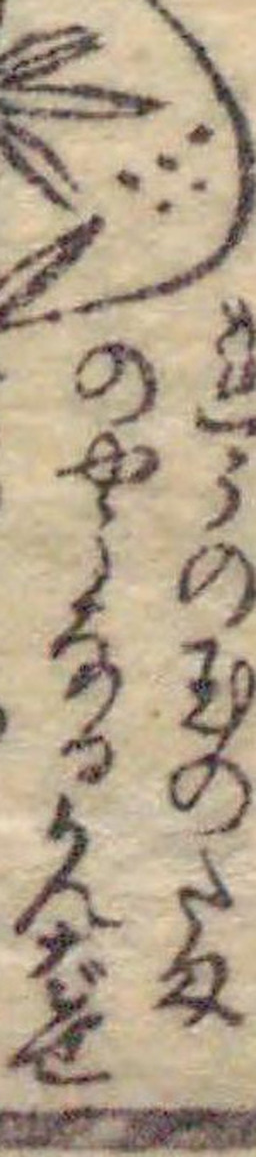のやうなるかんばせ
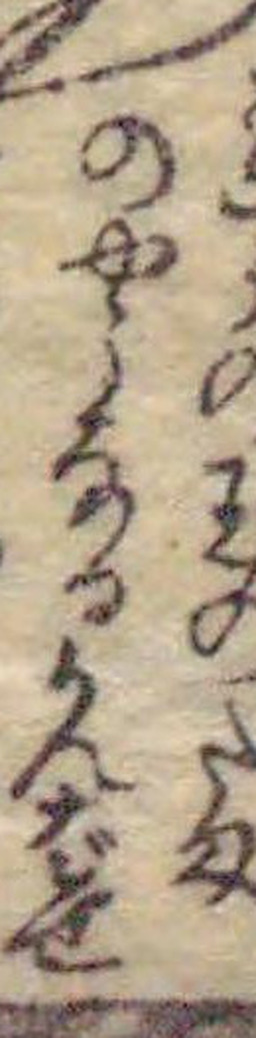のやうなるかんばせ
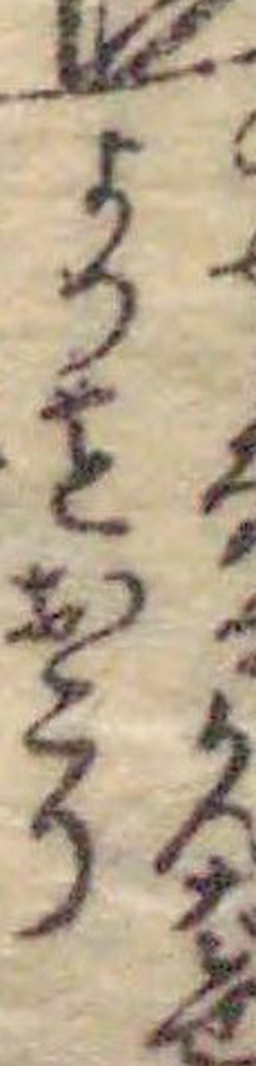よりことおこり
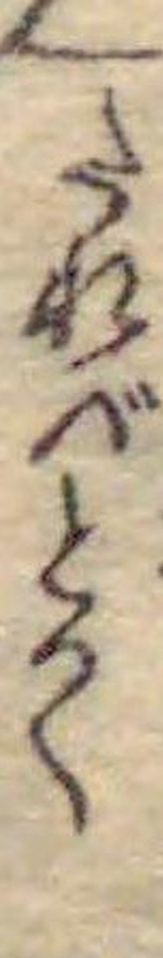たればとかく
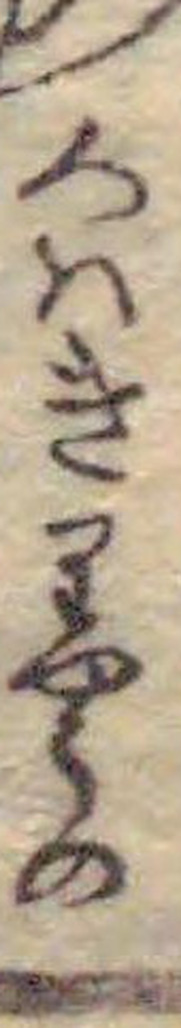人はきりやうの
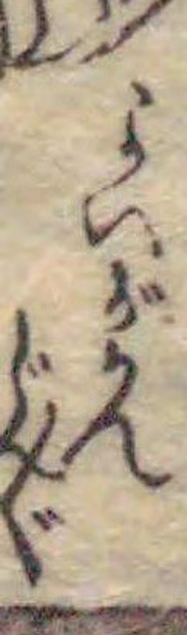よいがかん
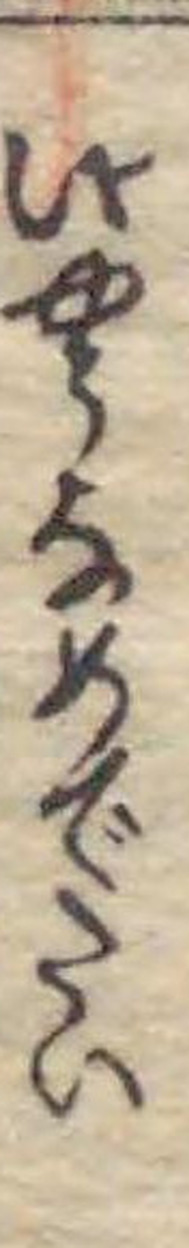此やうなめでたい
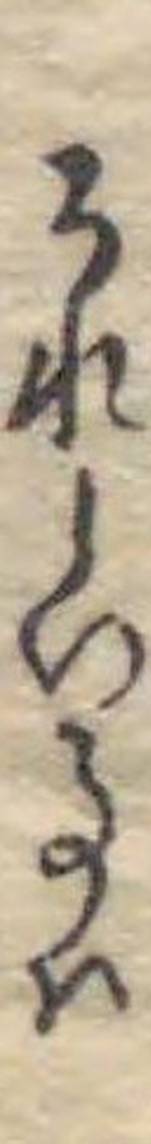うれしい事は
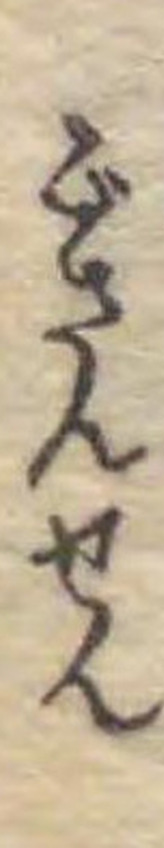ごさんせん
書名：鐘入七人化粧 : 3巻
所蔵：国立国会図書館 National Diet Library, JAPAN
